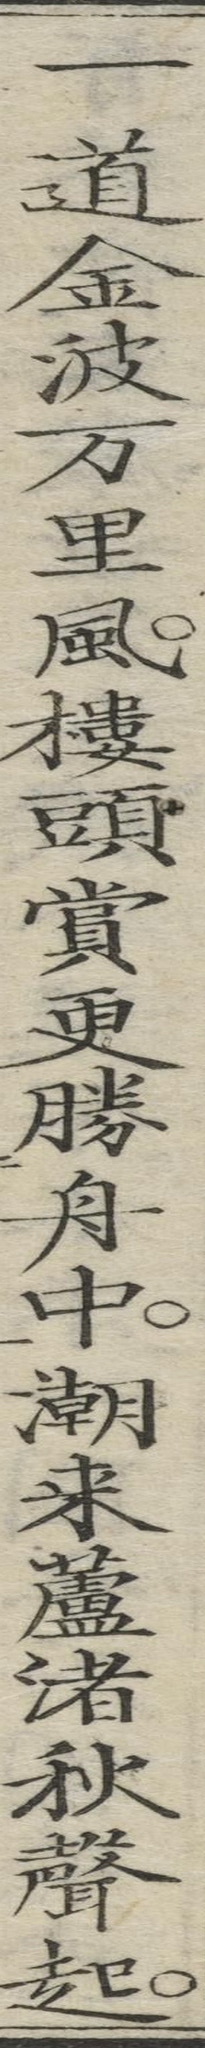一道金波万里風楼頭賞更勝舟中潮来蘆渚秋声起
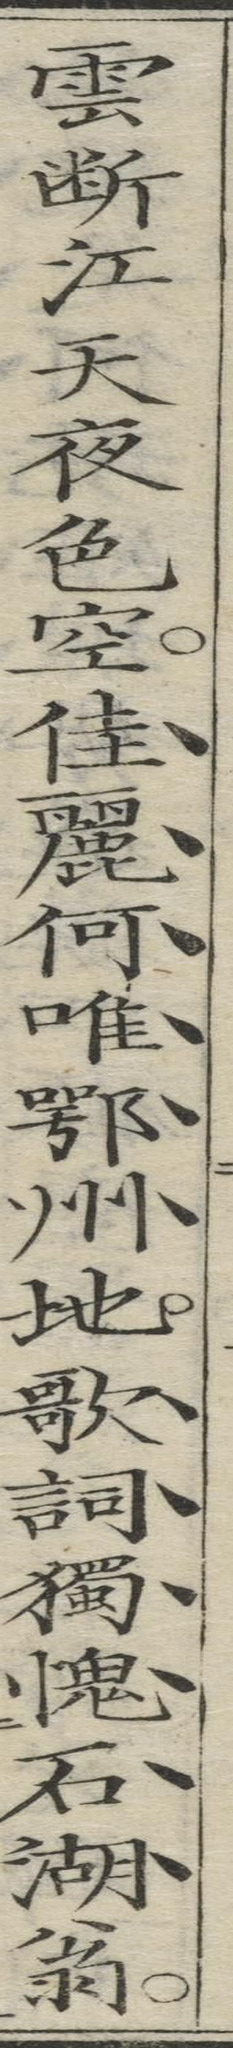雲断江天夜色空佳麗何唯鄂州地歌詞独愧石湖翁
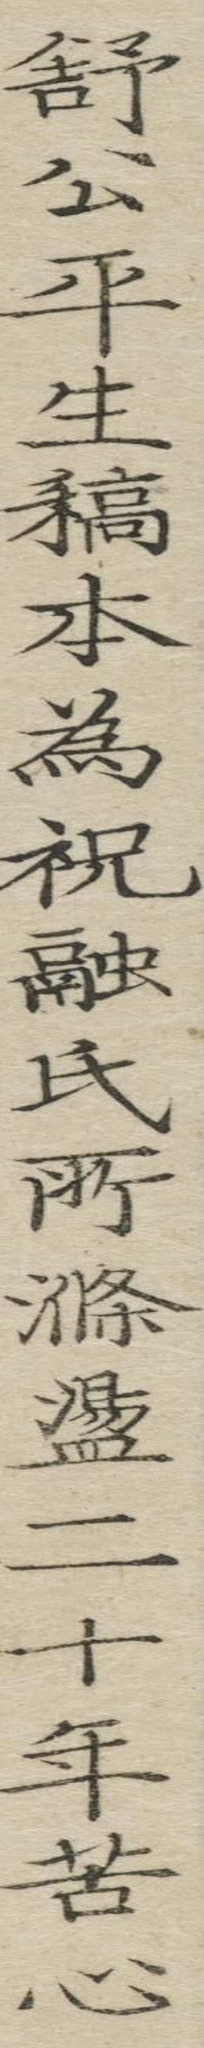舒公平生稿本為祝融氏所条盪二十年苦心
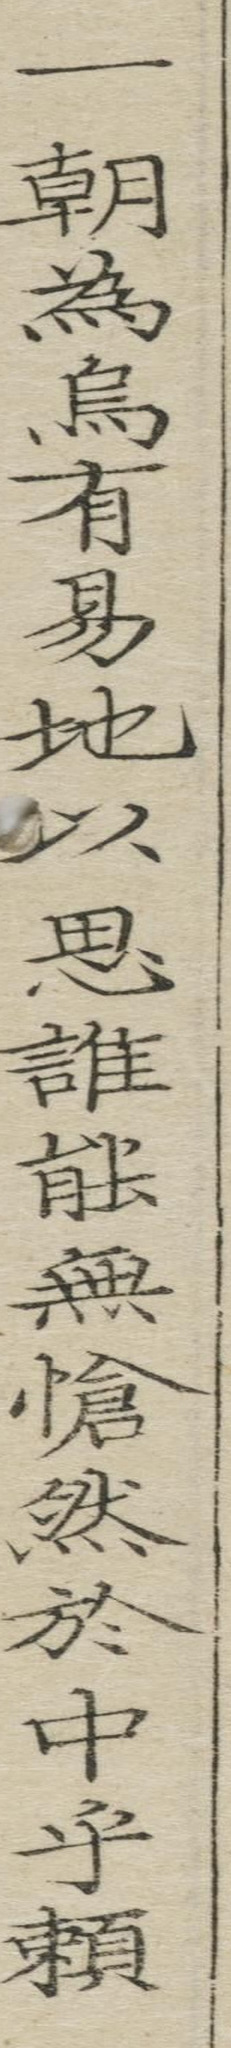一朝為烏有易地以思誰能無愴然於中乎頼
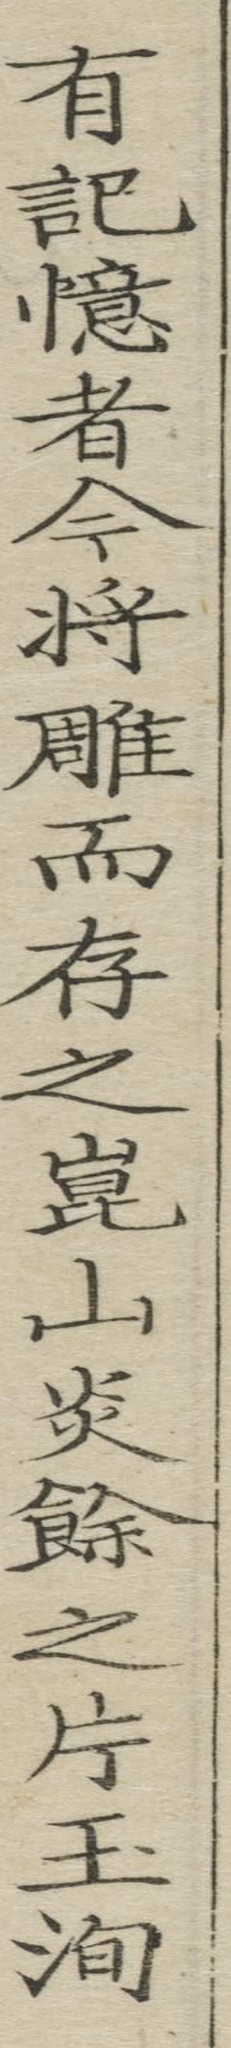有記憶者今将雕而存之崑山炎餘之片玉洵
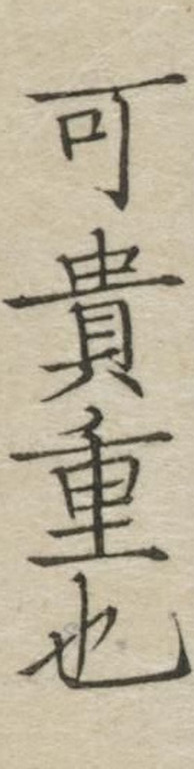可貴重也
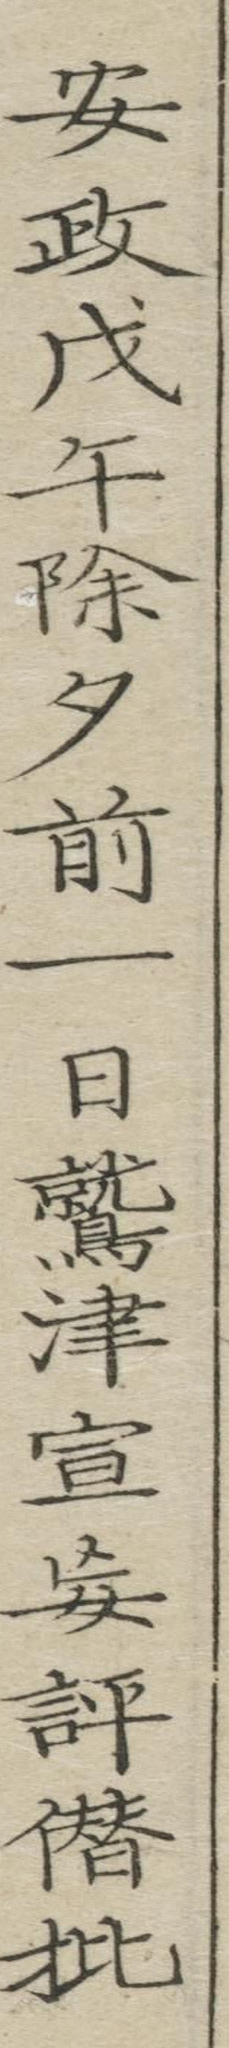安政戊午除夕前一日鷲津宣妄評僭批
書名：火後憶得詩
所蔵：東京大学地震研究所図書室 Earthquake Research Institute Library, The University of Tokyo, JAPAN
